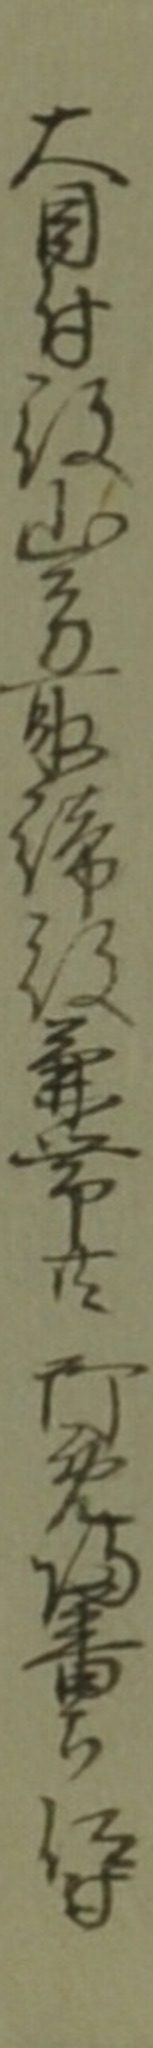大目付役山方取締役兼帯共御免帰番被仰付
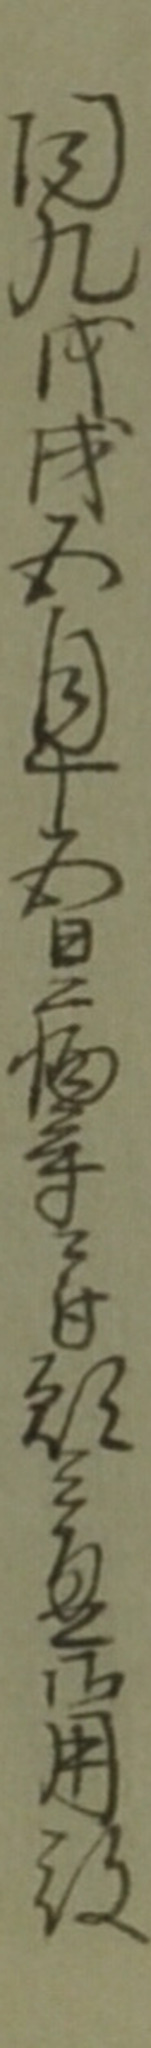一同九戊戌五月十五日病気ニ付願之通御用役
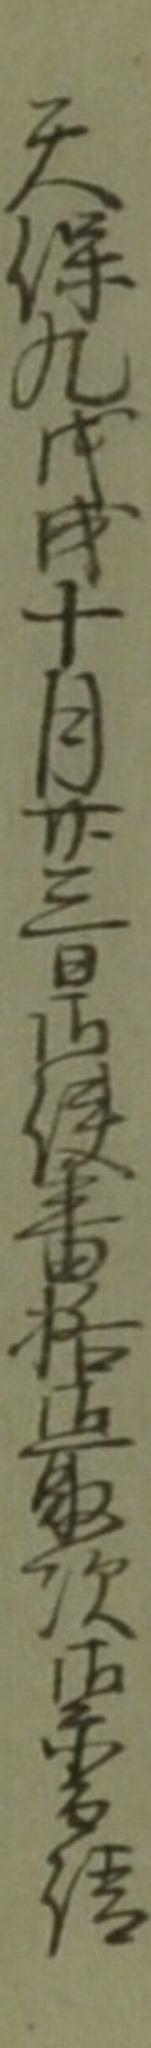一天保九戊戌十月廿三日御使番格取次御普請
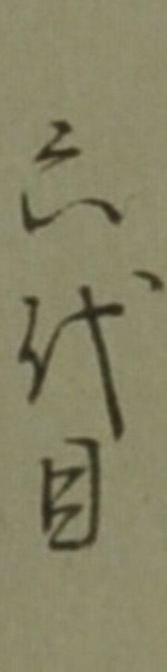六代目
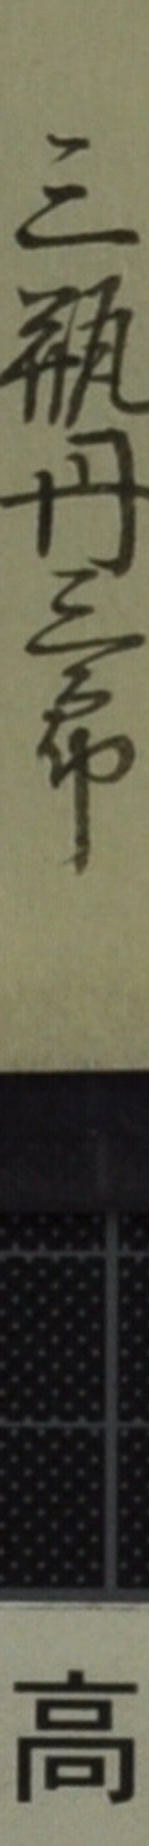三瓶丹三郎
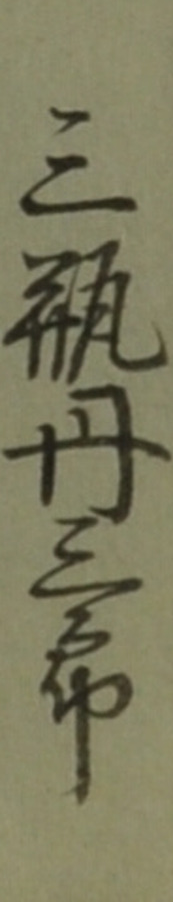三瓶丹三郎
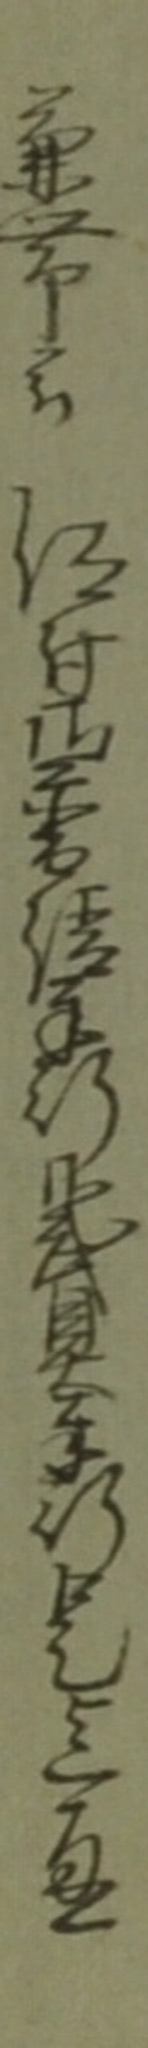兼帯被仰付御普請奉行御武具奉行是迄通
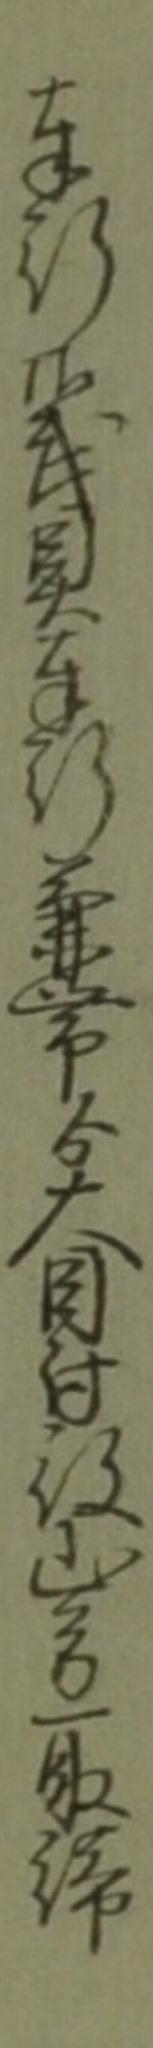一奉行御武具奉行兼帯ゟ大目付役山方取締
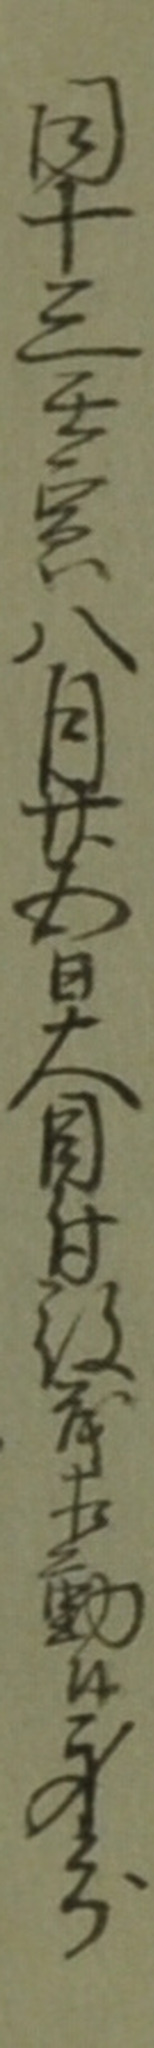一同十三壬寅八月廿五日大目付茂相勤候身分
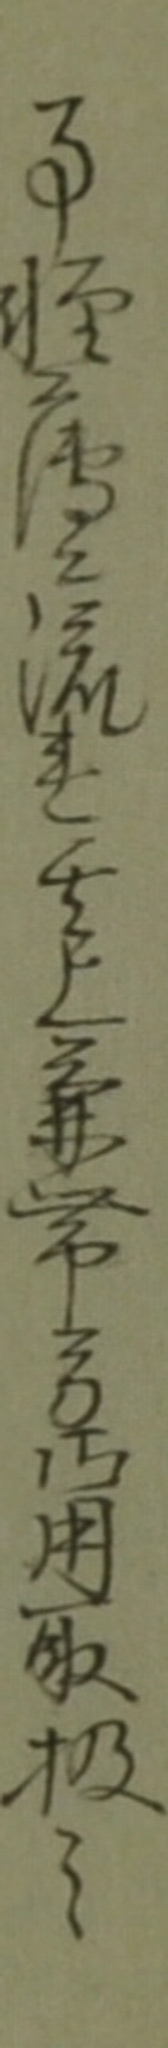事軽薄ニ流れ其上兼帯方御用取扱之
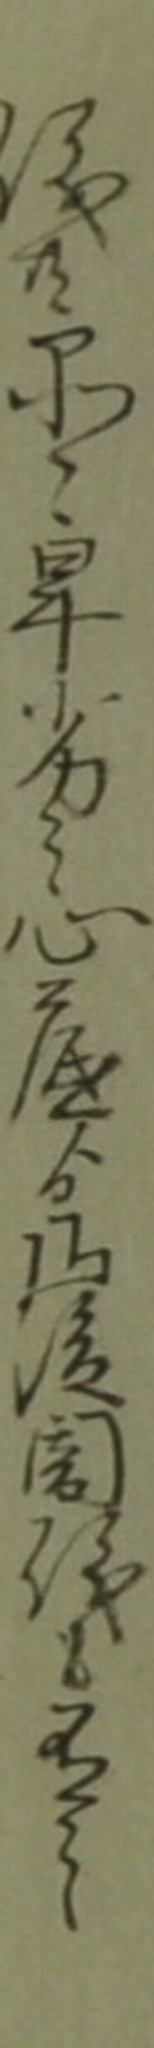儀共品〃卑劣之心底ゟ御後闇儀も有之
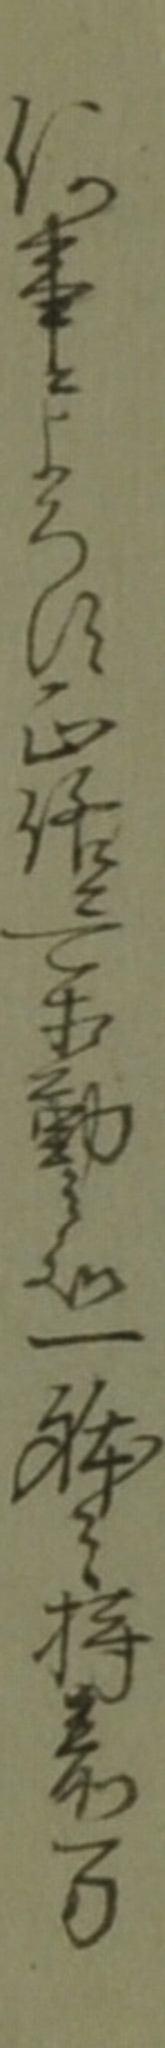何事ニよろす正格ニ可相勤之処一躰之持前万
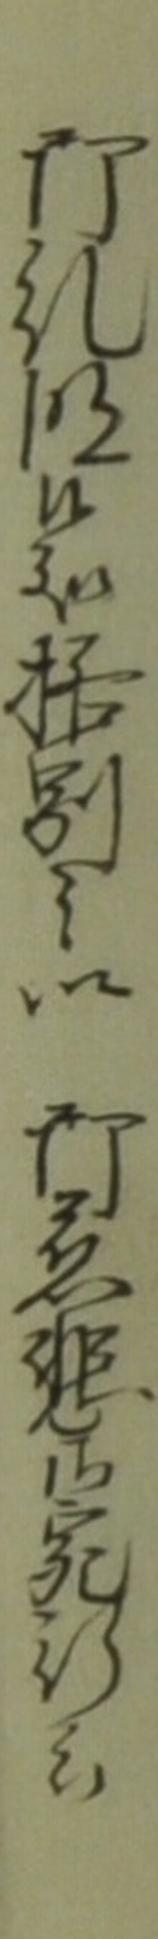御糺明候処格別之以御慈悲御宛行被
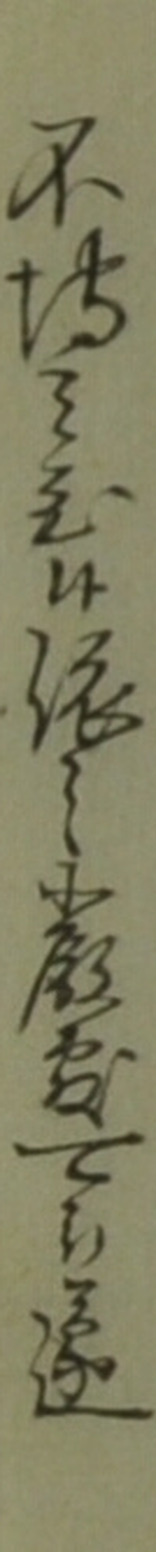不埒之至候依之厳敷可被遂

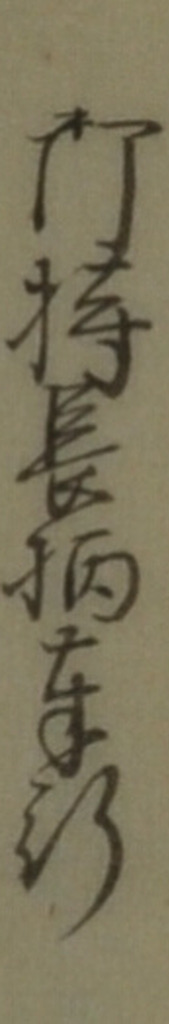御持長柄奉行
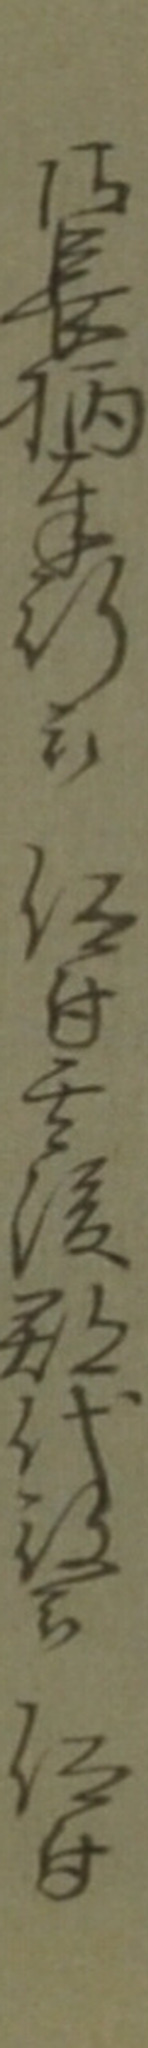御長柄奉行被仰付其後郡代役被仰付
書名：諸御役代々録（三）
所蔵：伊那市立高遠町図書館・合同会社AMANE
